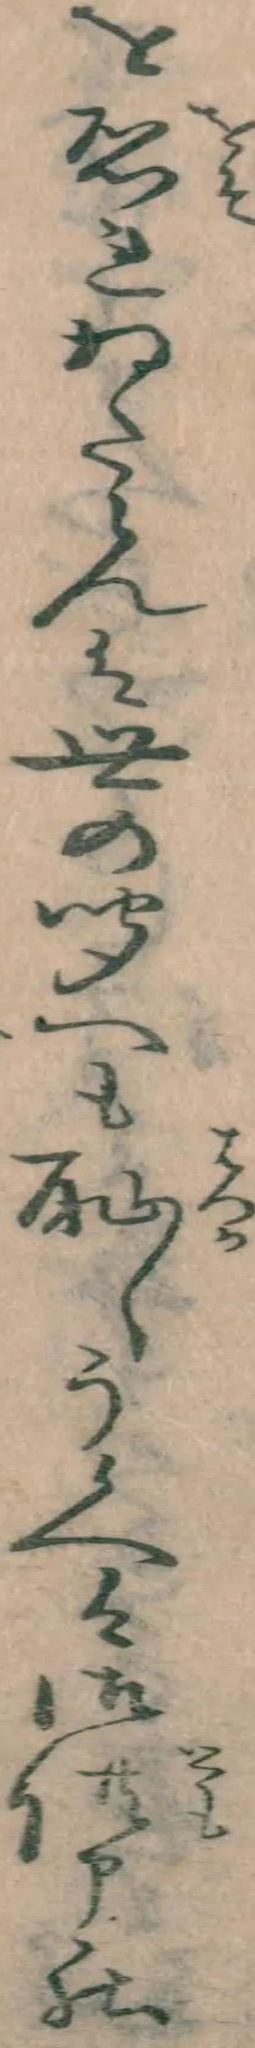を恐れゐたらんは世の聞へも恥しう候へは御供申罷
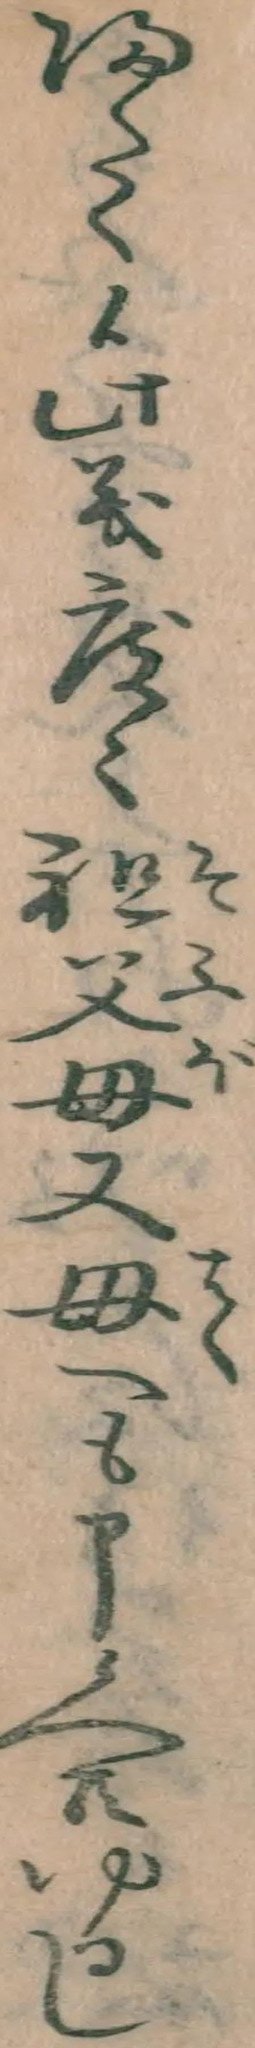帰たく候此義度々祖父母又母へも申候へ共ゆるし
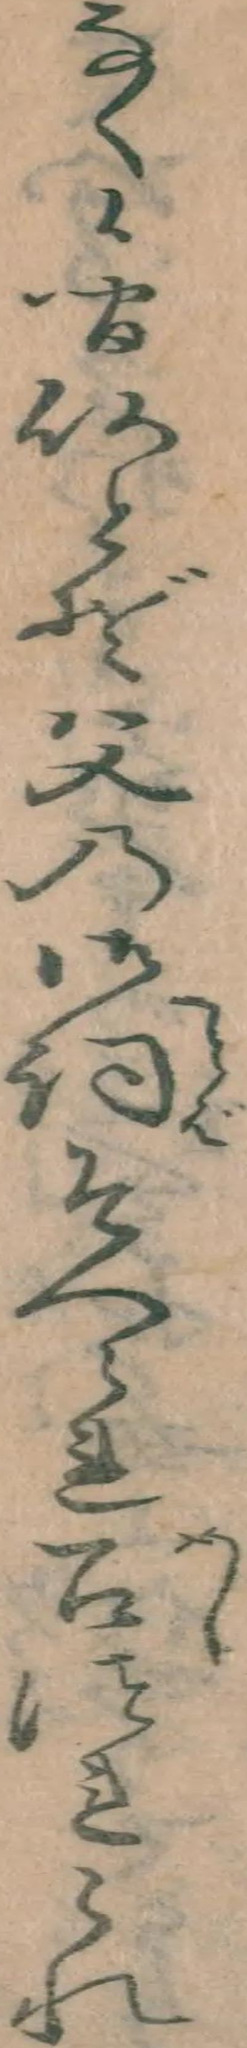なく候間何とぞ父の詞そへられ召つれられ
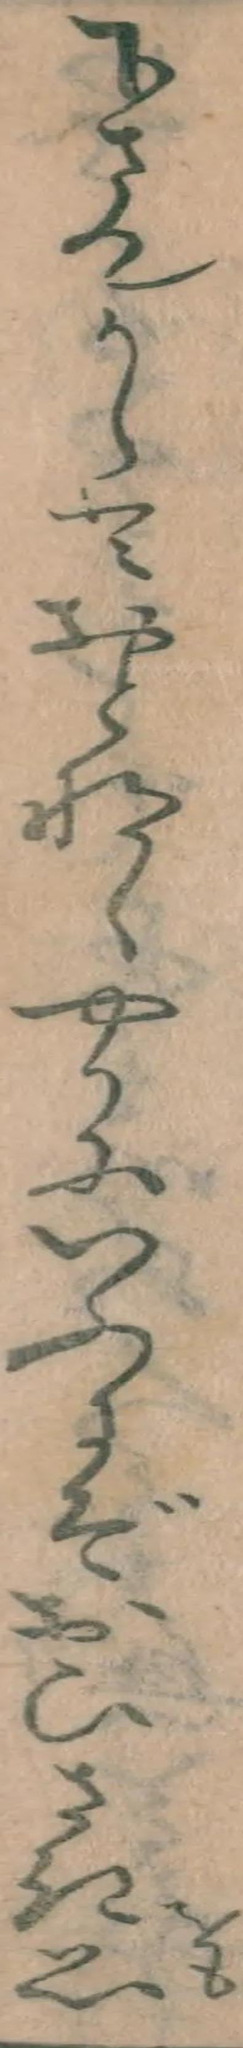下されかしとおとなしやかにいふにぞおひさき思
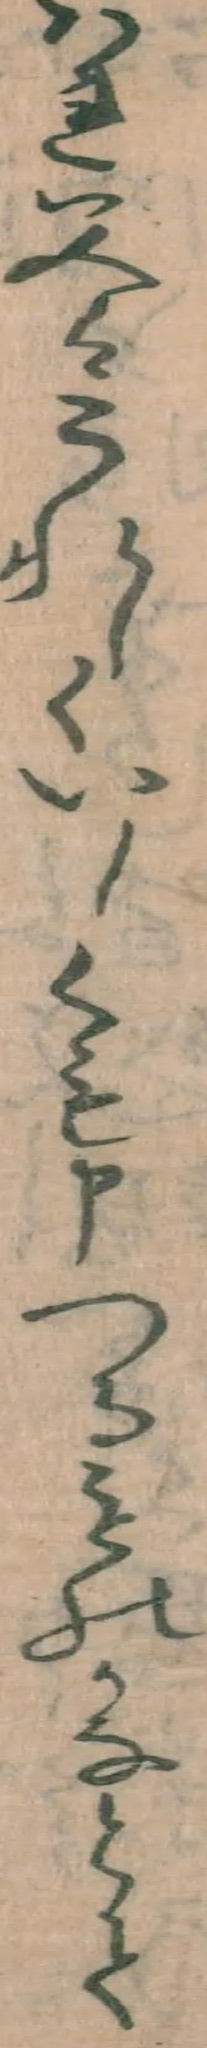はれ父はうれしくいしくも申つるものかなとて
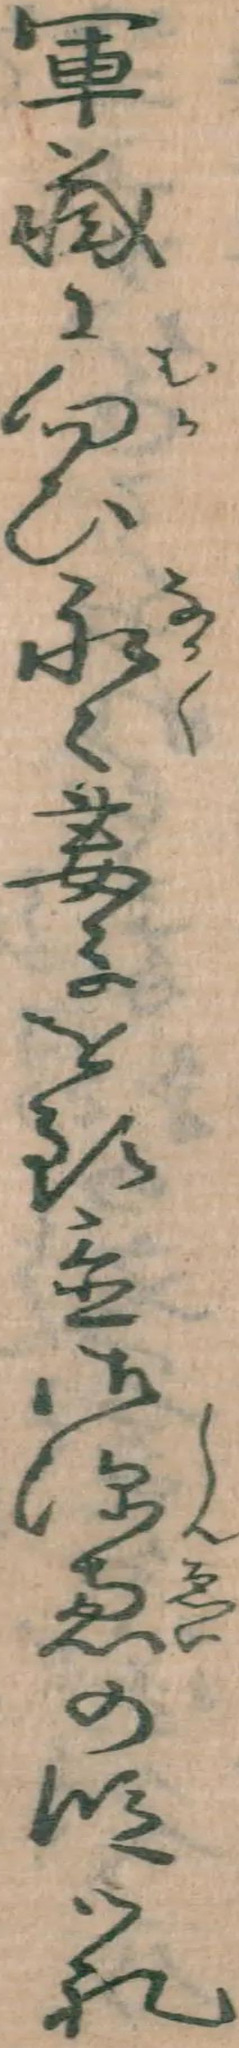軍蔵に向ひ永々妻子を預置御深恵の段御礼
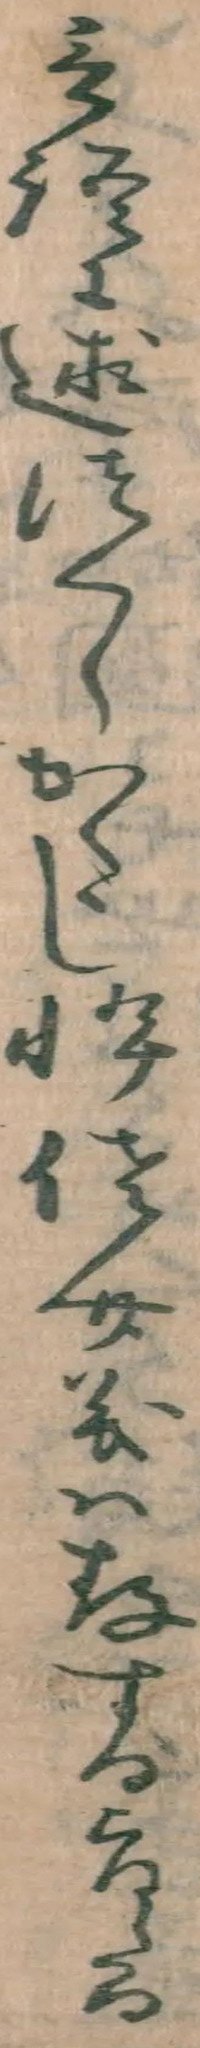言語に述つくしかたし伜佐介義は存する旨？た？る？
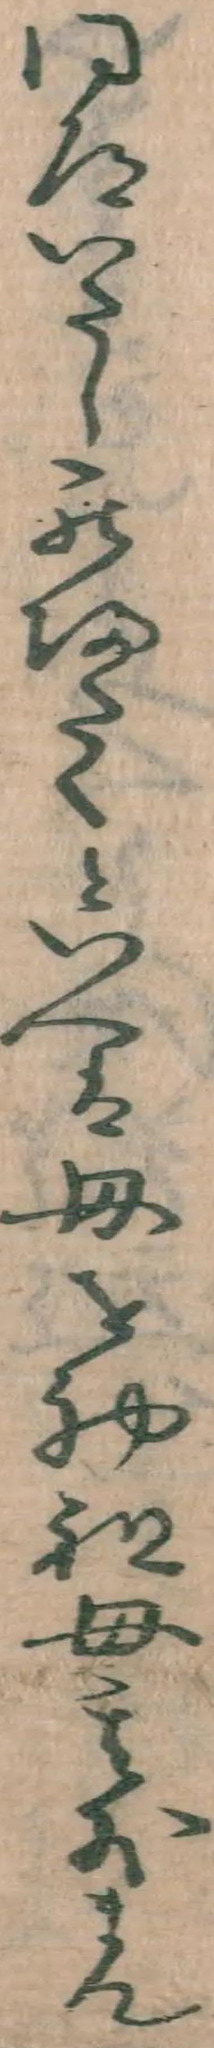同道いたし罷帰たく候といへは母を初祖母其外まて
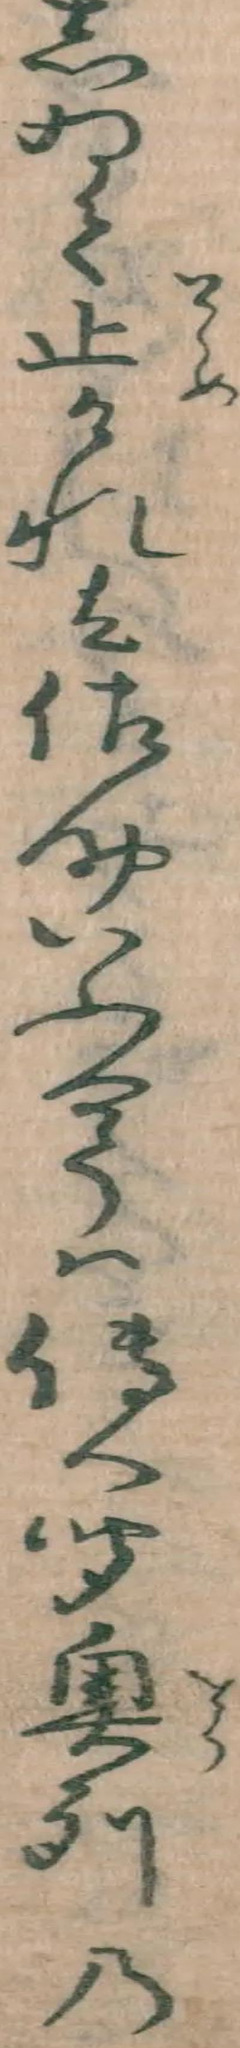しゐて止けれは佐助いふやうは伝へ聞奥州の
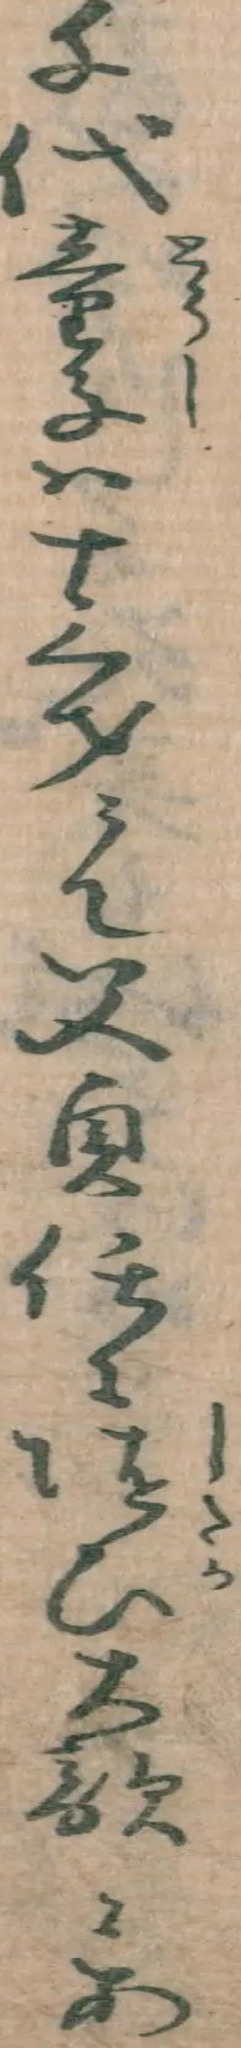千代童子は十三歳にて父貞任に随ひ大敵にあ
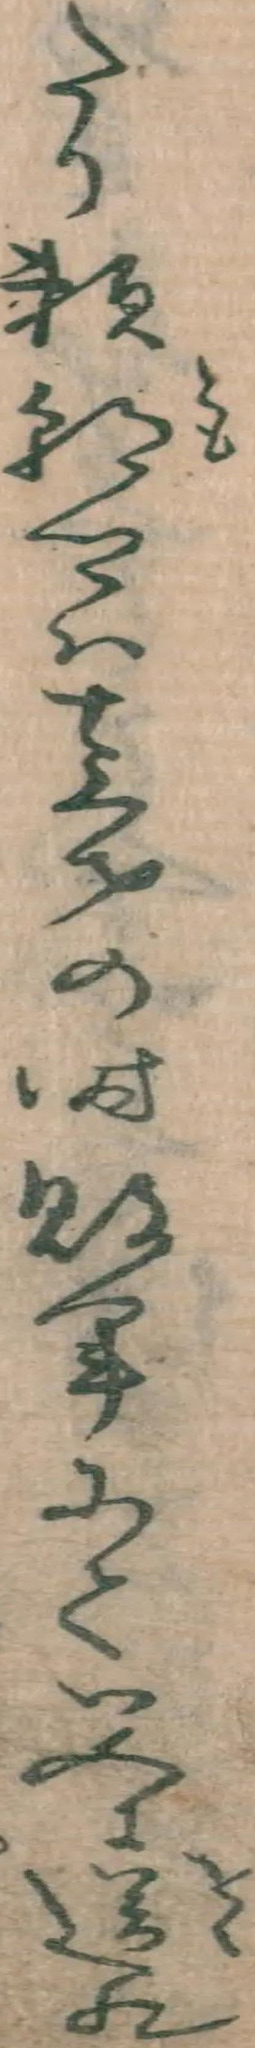たり頼朝卿は十三歳の時敗軍にて父に送れ
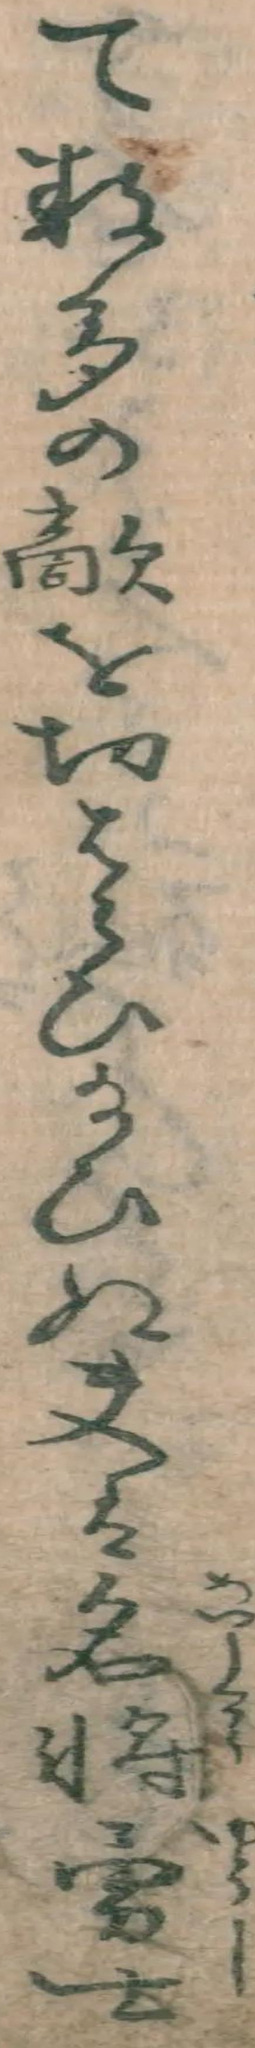て数多の敵を切はらひ給ひぬ夫は名将勇士
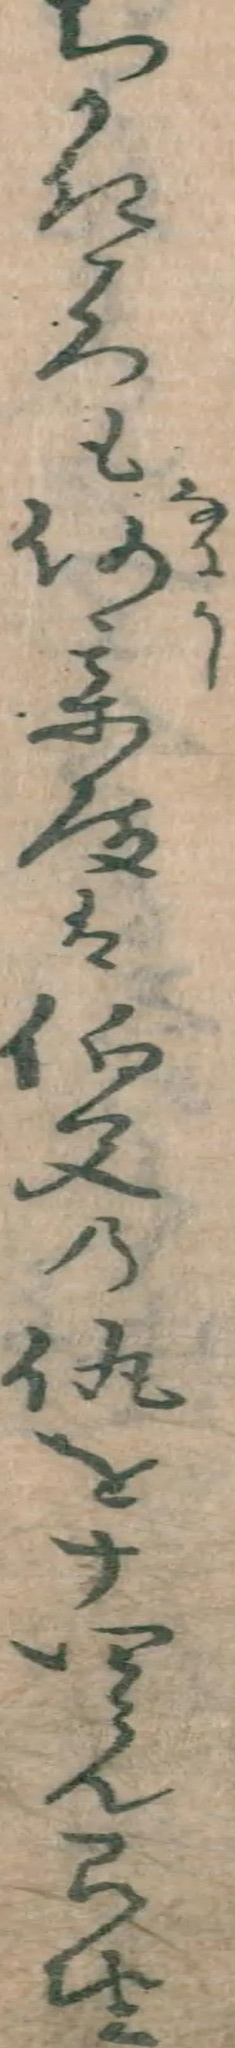ちかきころも何某殿は伯父の仇を十四にて即坐
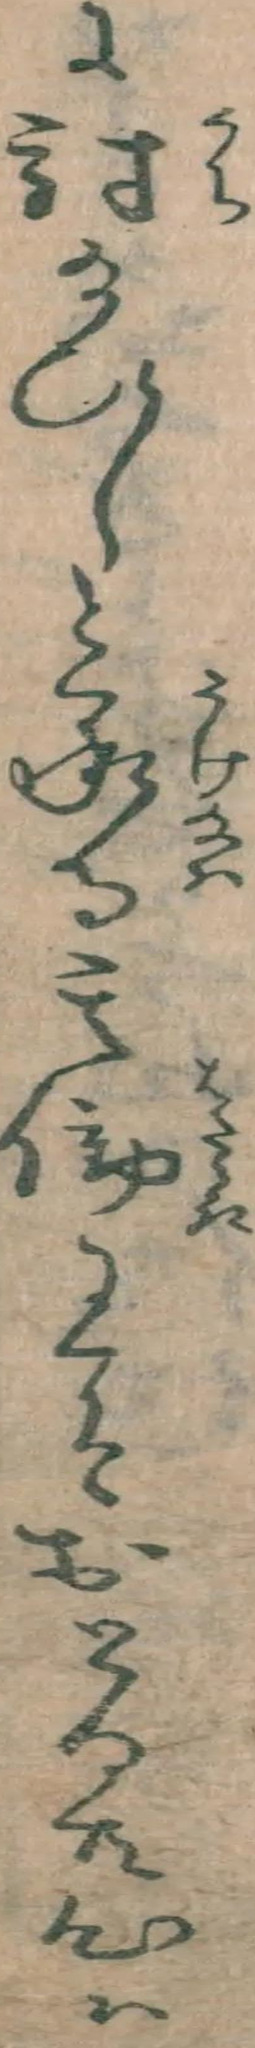に討給ひしと承る其働にておとる共心は

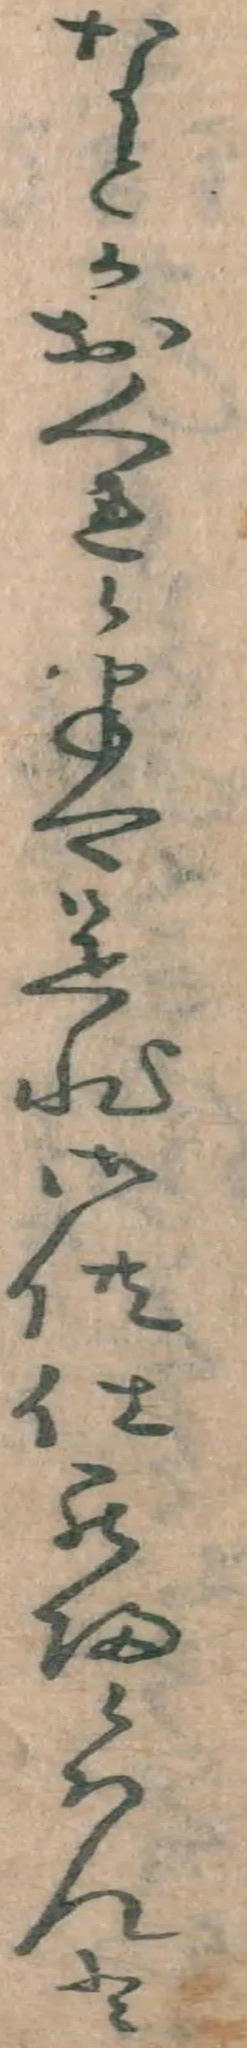なとかおくれ候半や是？然？御供仕罷帰候はんと
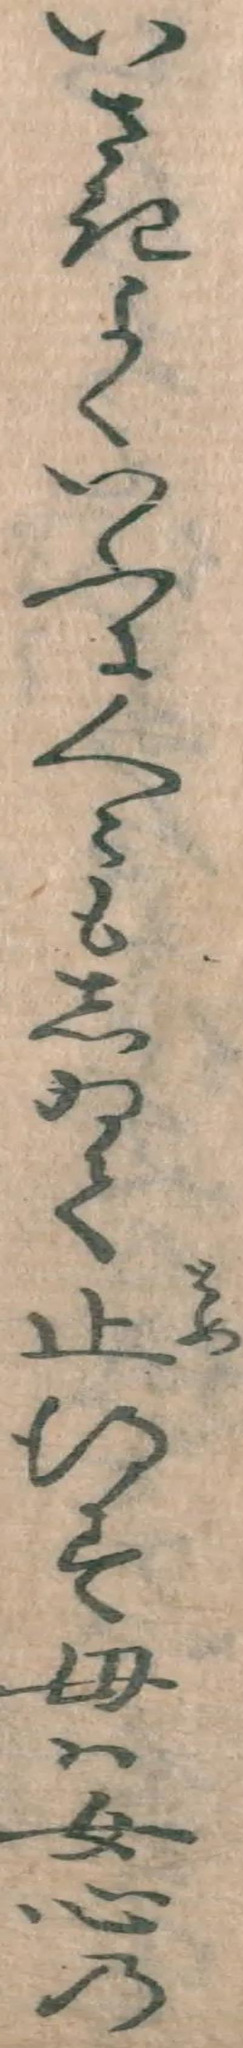いさきよくいふに人々もしゐて止行す母は女心の
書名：怪談御伽童 5巻. [2]
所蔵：国立国会図書館 National Diet Library, JAPAN
